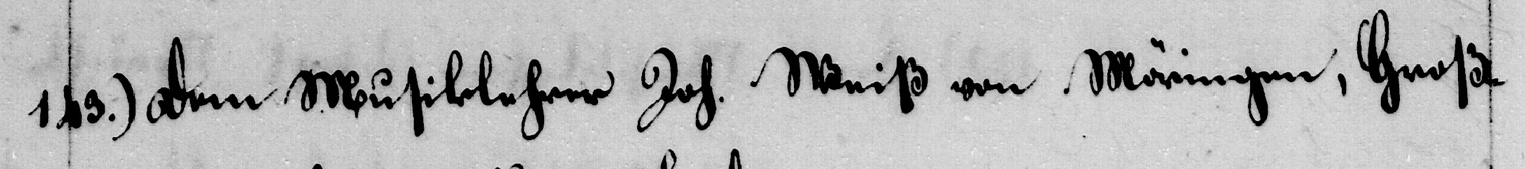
143.) Dem Musiklehrer Joh. Weiß von Märingen, Groß¬
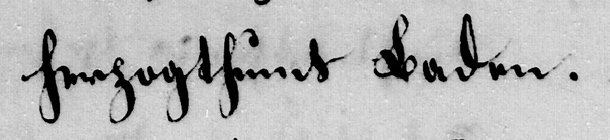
herzogthums Baden.
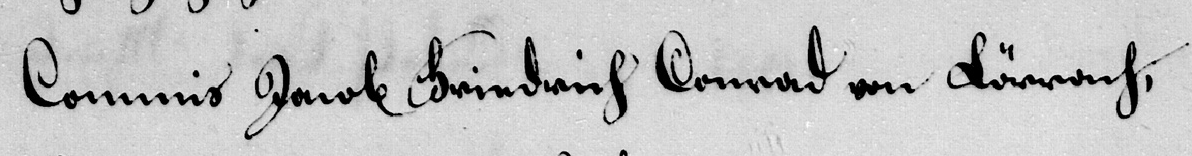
Commis Jacob Friedrich Conrad von Lörrach,
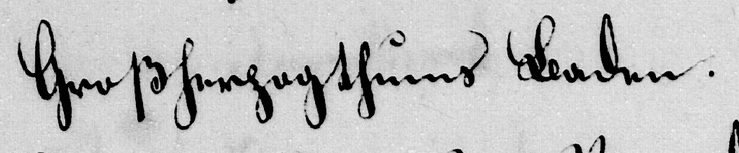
Großherzogthums Baden.
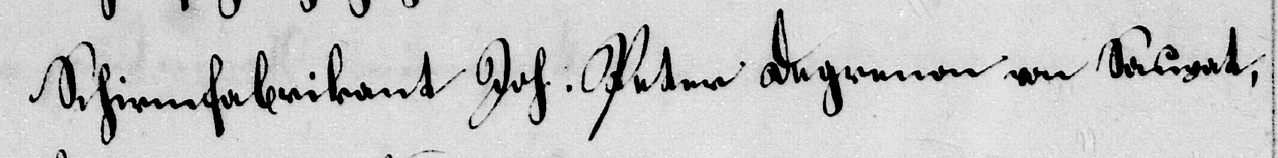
Schirmfabrikant Joh. Peter Degrenon von Sauvat,
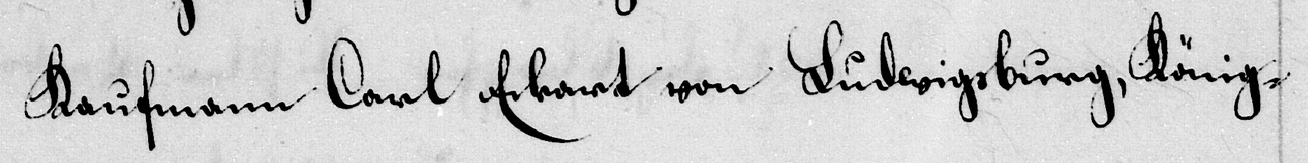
Kaufmann Carl Eckart von Ludwigsburg, König¬
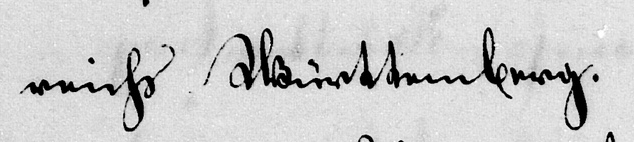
reichs Württemberg.
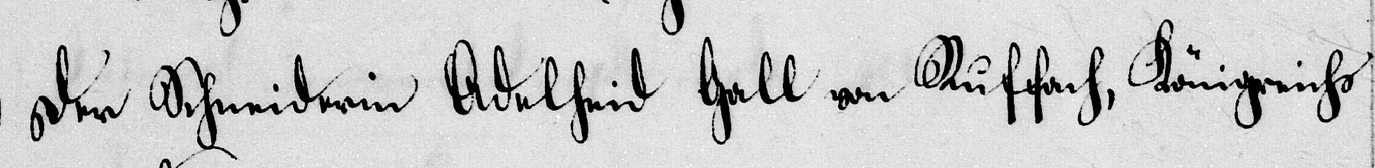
Der Schneiderin Adelheid Gall von Ruffach, Königreichs
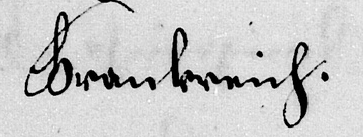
Frankreich.
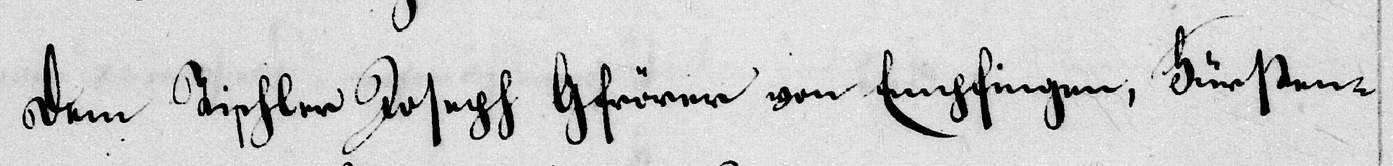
Dem Tischler Joseph Gfrörer von Empfingen, Fürsten¬
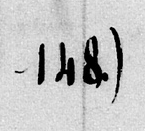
148.)
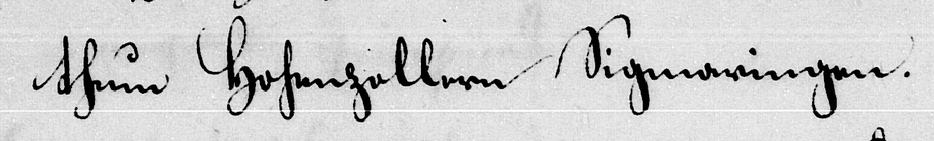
thum Hohenzellern Sigmaringen.
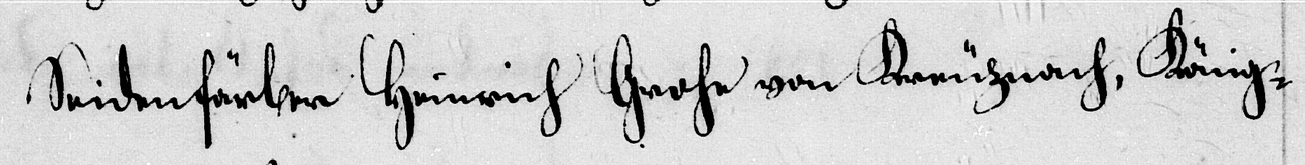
Seidenfärber Heinrich Grohe von Kreuznach, König¬
